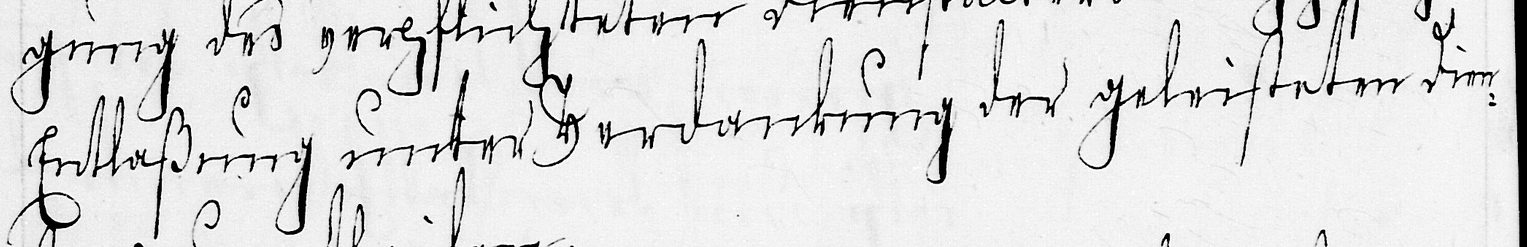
Entlaßung unter Verdankung der geleisteten Dien¬
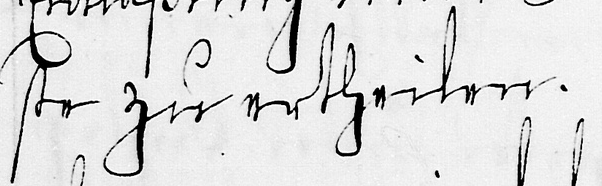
ste zu ertheilen.
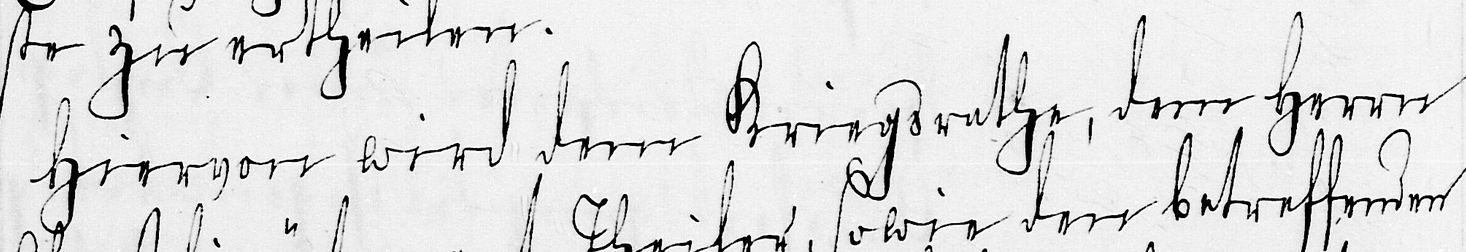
Hiervon wird dem Kriegsrathe, dem Herrn
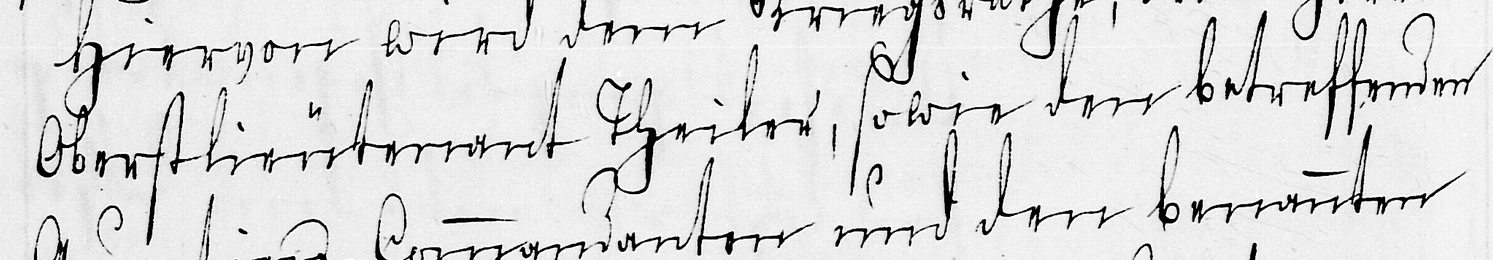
Oberstlieutenant Theiler, sowie den betreffenden
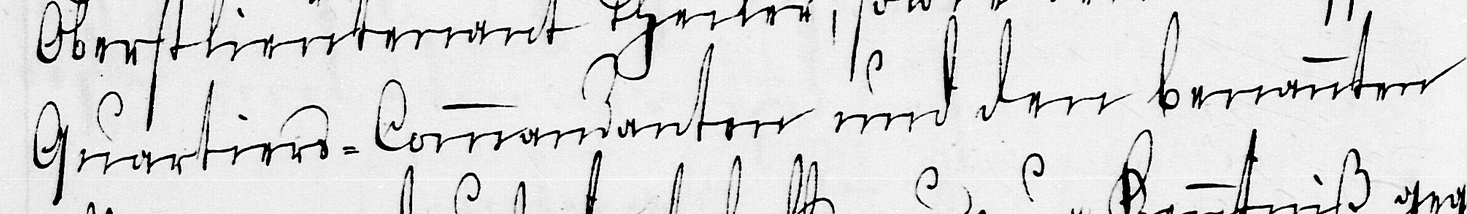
Quartiers-Commandanten und den benannten
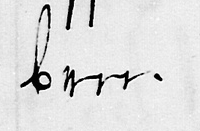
ben.
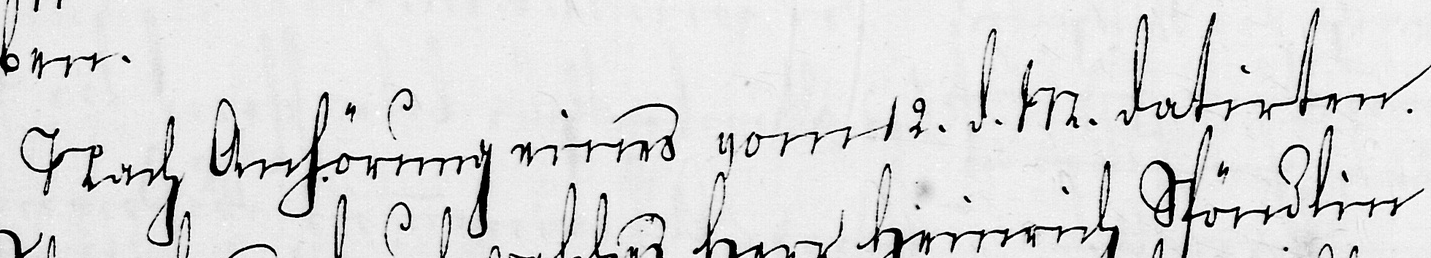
Nach Anhörung eines vom 12. d. M. datirten
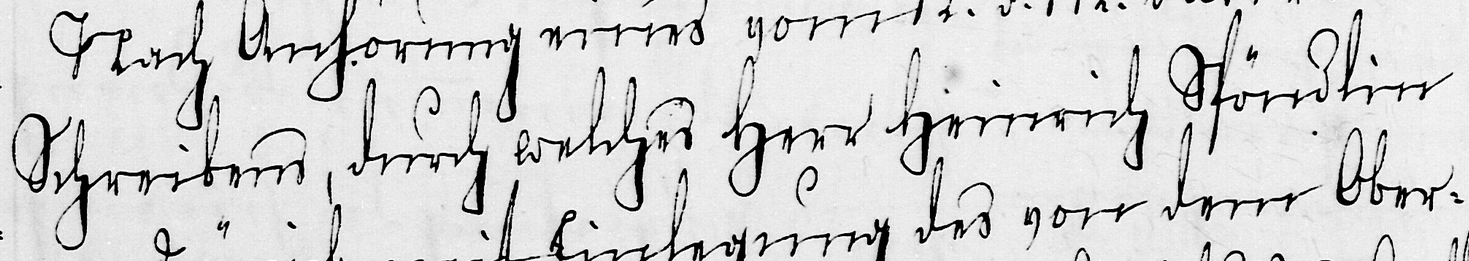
Schreibens, durch welches Herr Heinrich Spöndlin
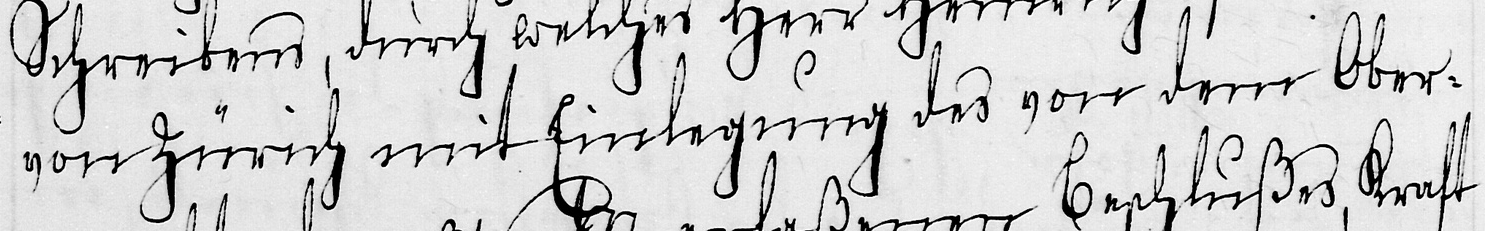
von Zürich mit Einlegung des von dem Ober¬
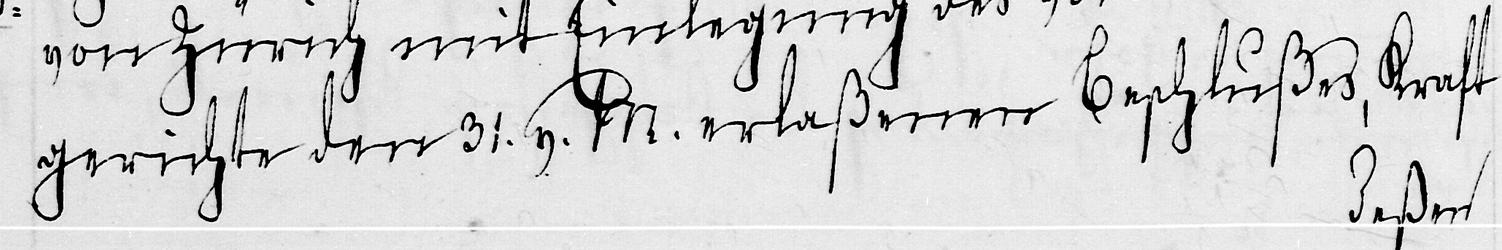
gerichte den 31. v. M. erlaßenen Beschlußes, Kraft
